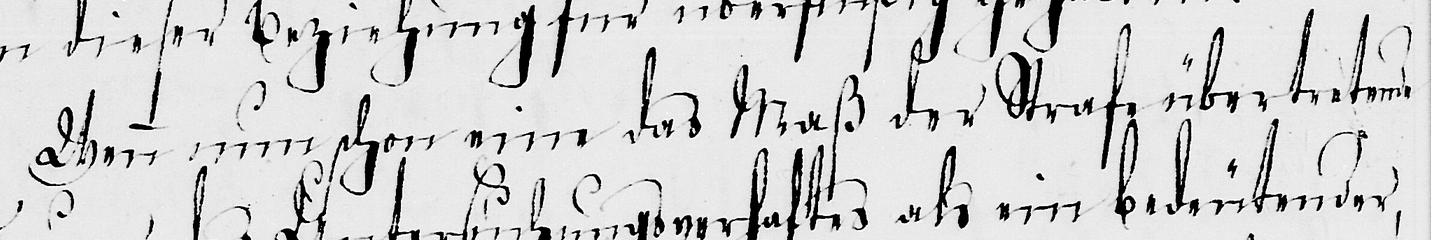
Wenn nun schon eine das Maß der Strafe übertreten¬
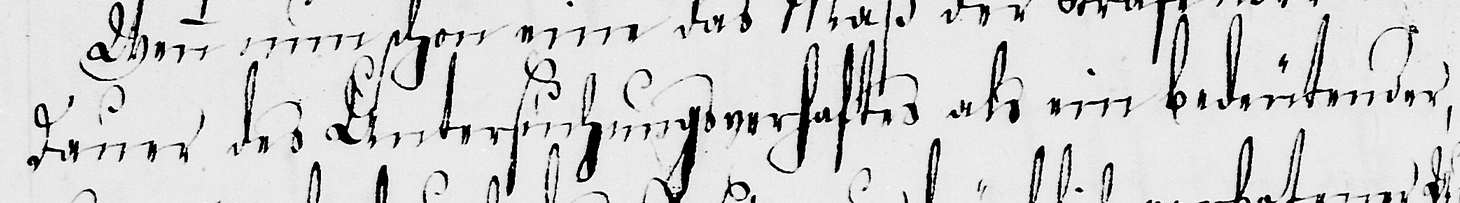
Dauer des Untersuchungsverhaftes als ein bedeutender,
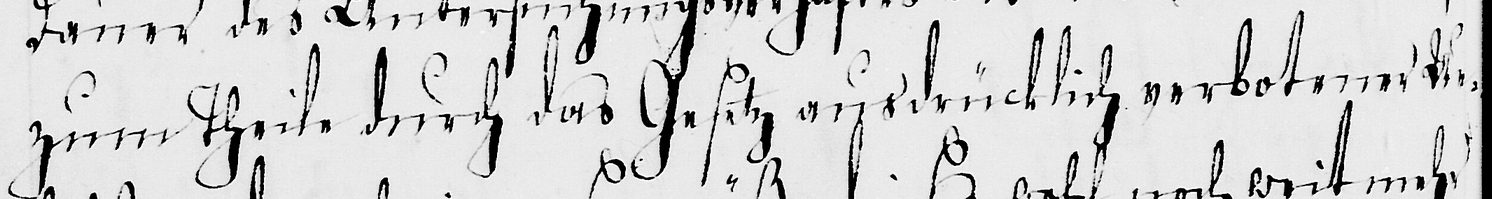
zum Theile durch das Gesetz ausdrücklich verbotener Ue¬
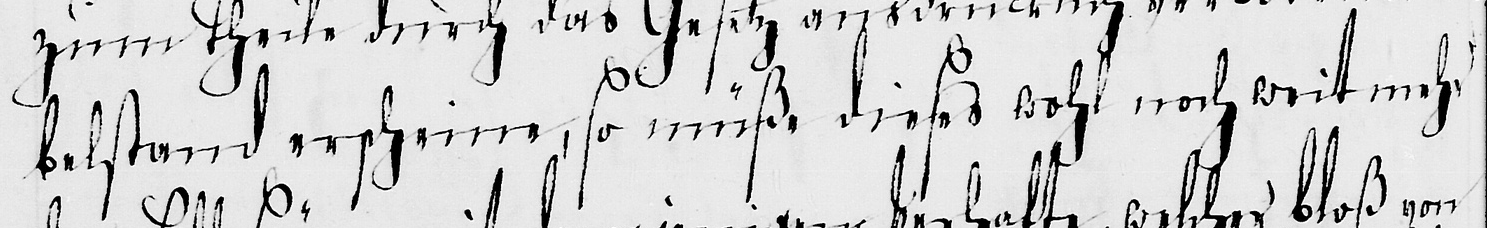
belstand erscheine, so müße dieses wohl noch weit mehr
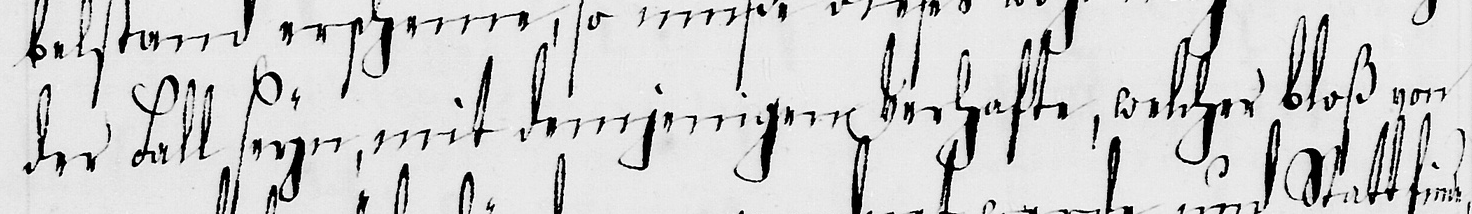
der Fall seyn, mit demjenigen Verhafte, welcher bloß von
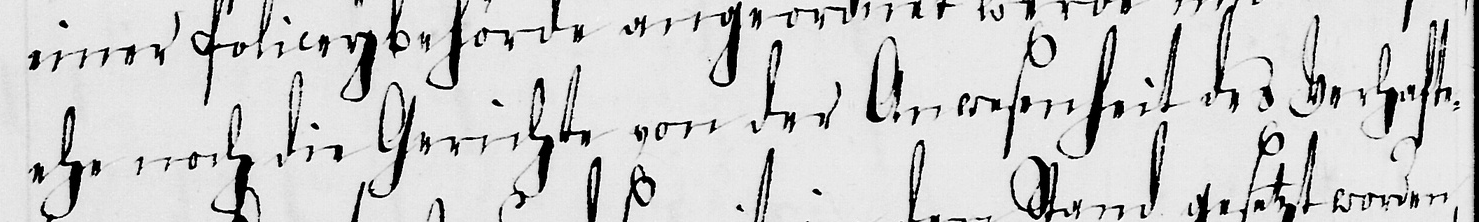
ehe noch die Gerichte von der Anwesenheit des Verhaft¬
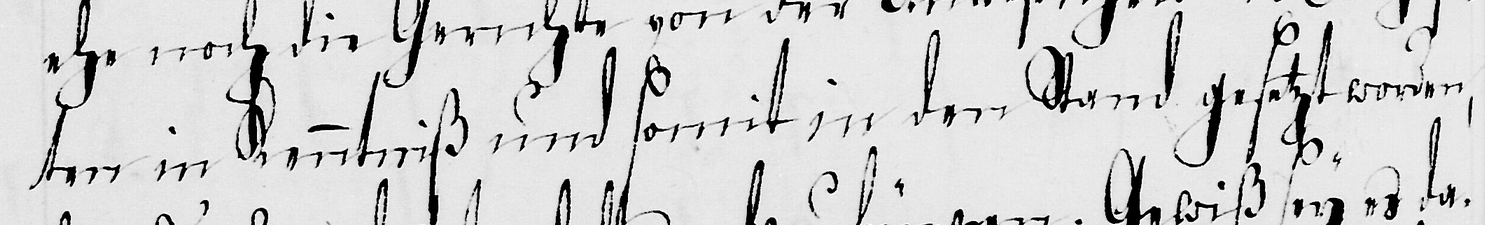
eten in Kenntniß und somit in den Stand gesetzt wor¬
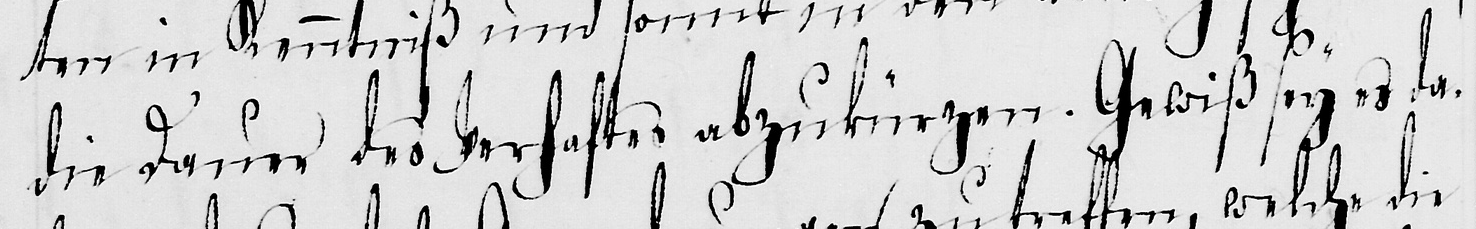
die Dauer des Verhaftes abzukürzen. Gewiß sey es d¬
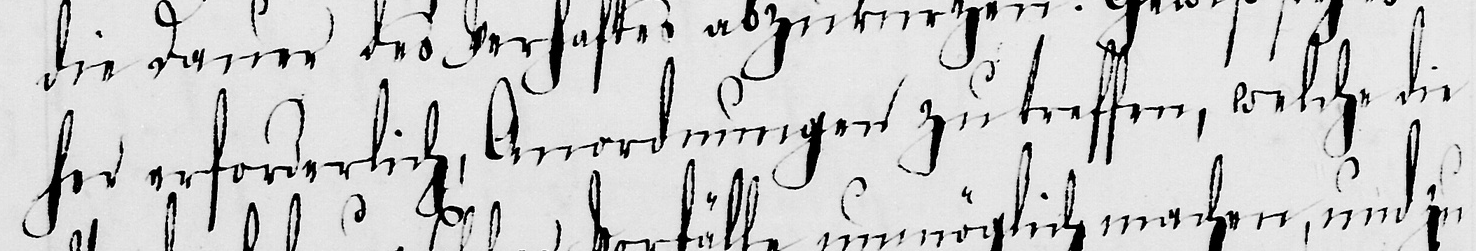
aher erforderlich, Anordnungen zu treffen, welche die
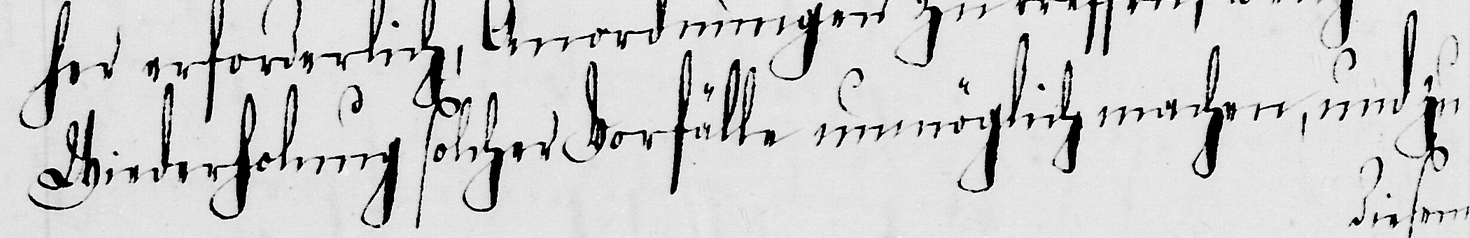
Wiederholung solcher Vorfälle unmöglich machen, und
